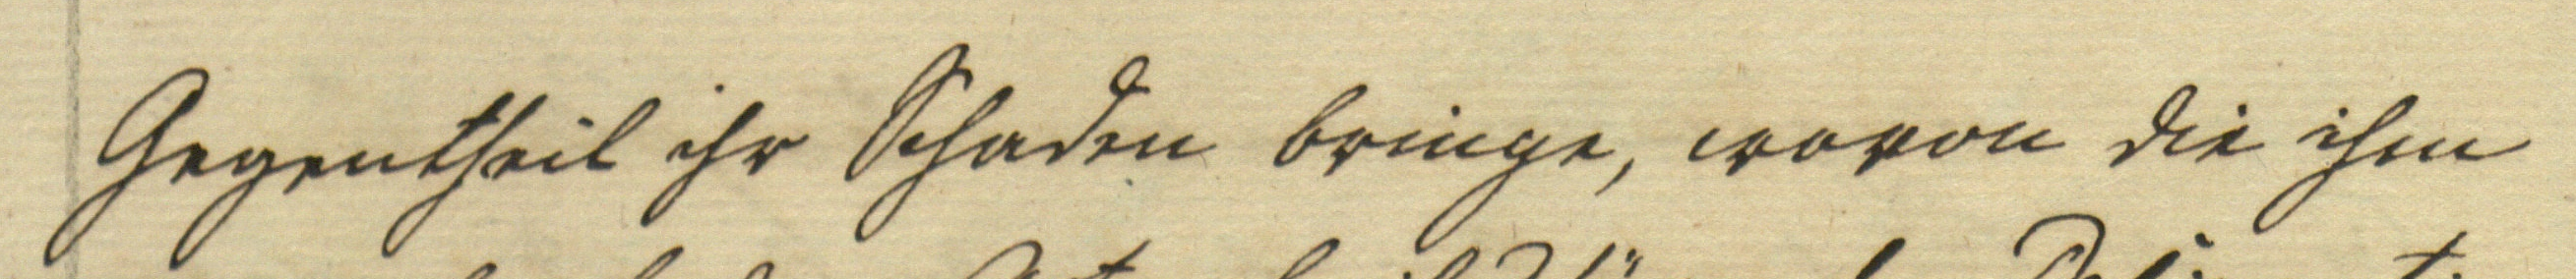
Gegentheil ihr Schaden bringe, wovon die ihm
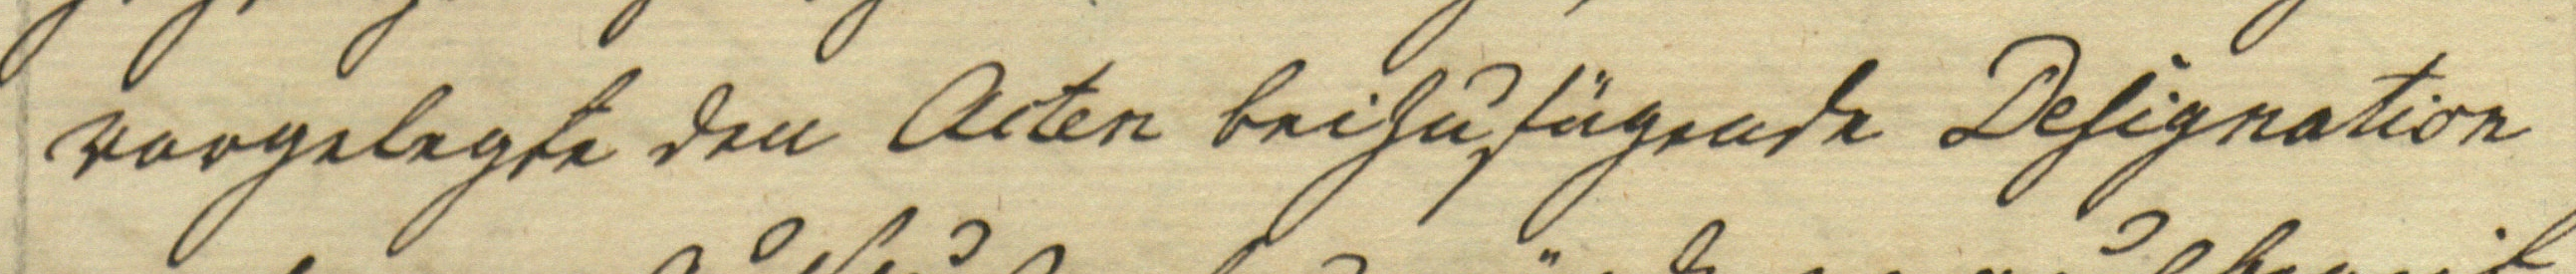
vorgelegte den Acten beizufügende Designation
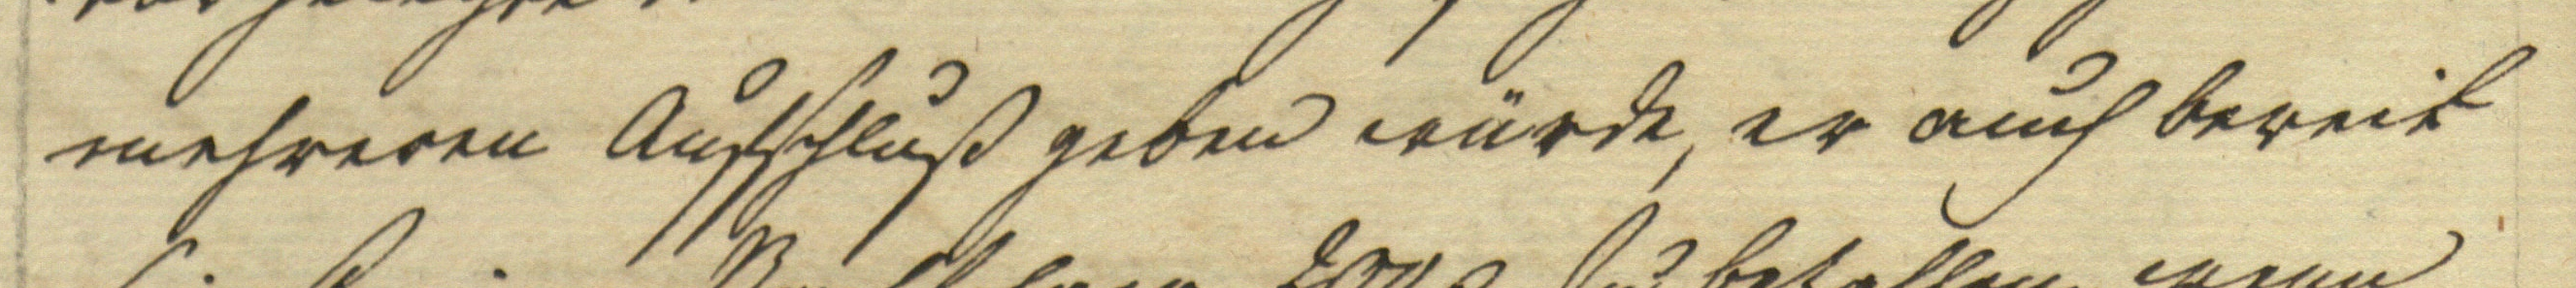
mehreren Aufschluß geben würde, er auch bereit
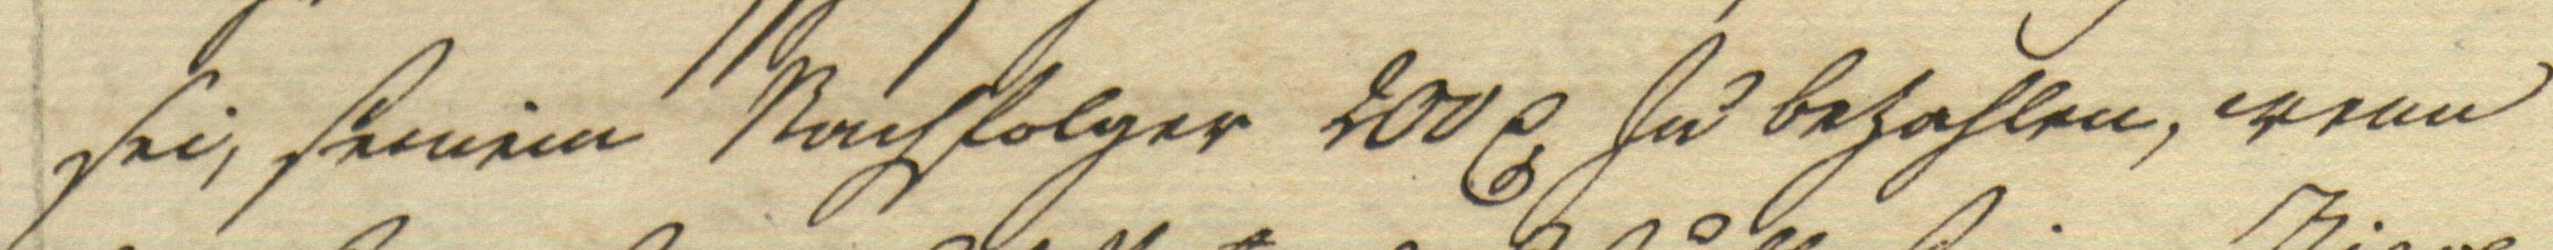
sei, seinem Nachfolger 200 l. zu bezahlen, wenn
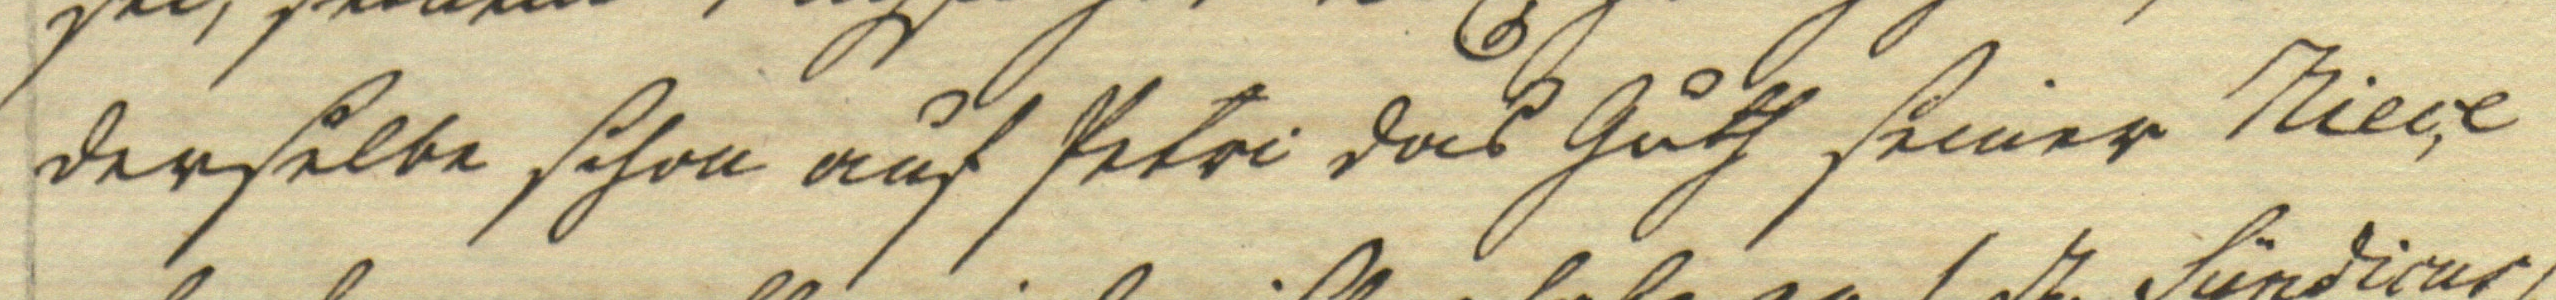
derselbe schon auf Petri das Guth seiner Niece
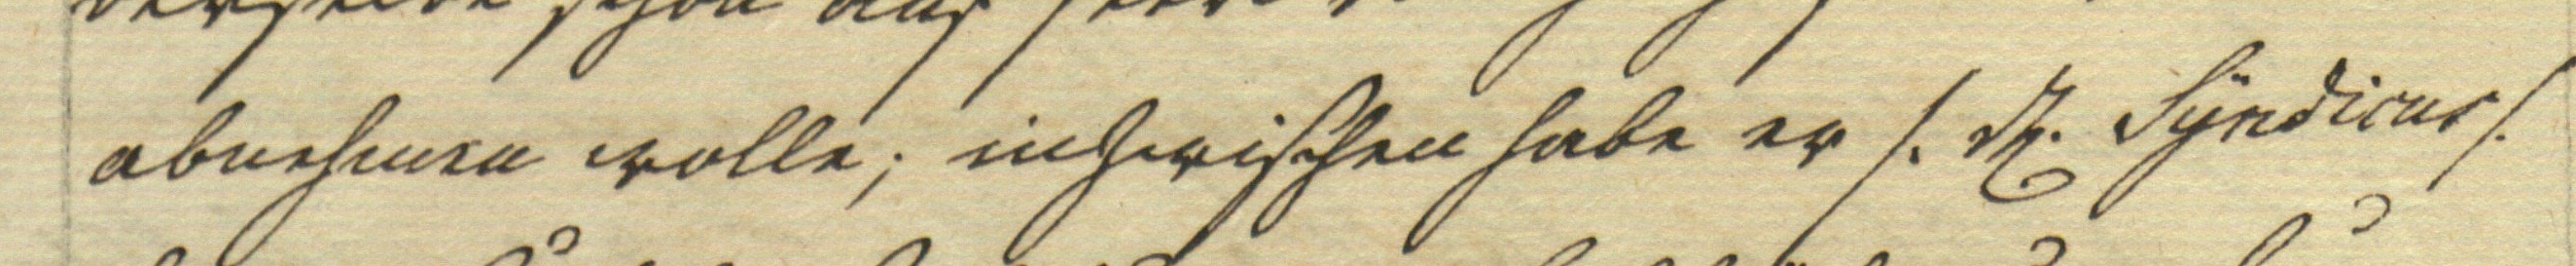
abnehmen woll,; inzwischen habe er /.dh. Sÿndicus/.
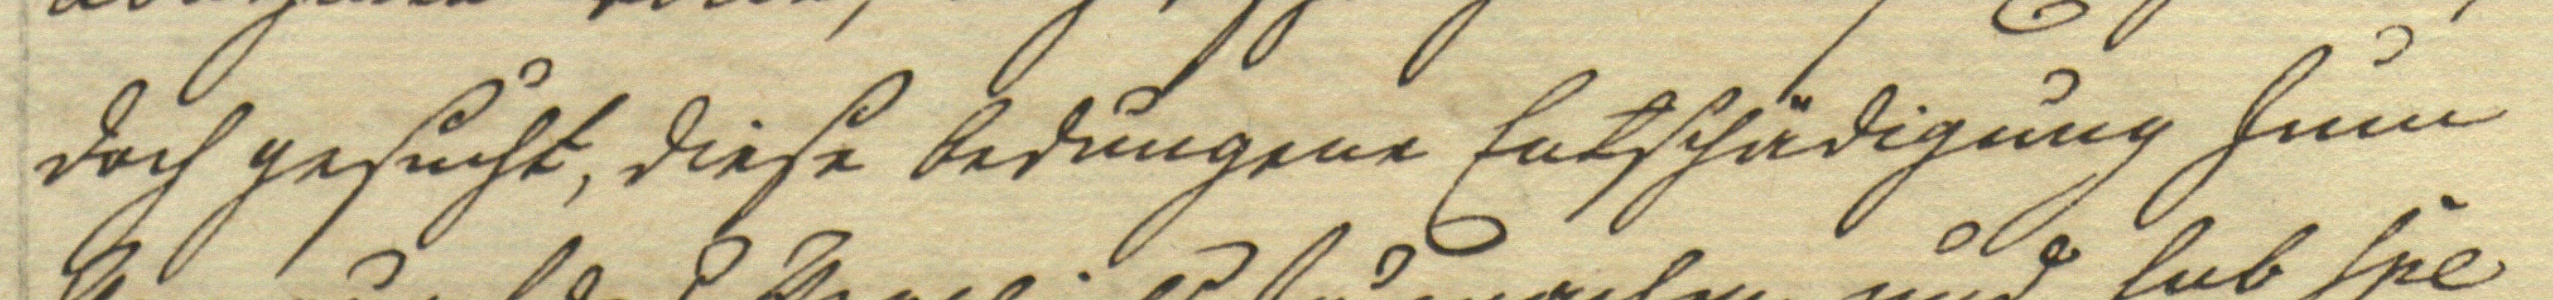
doch gesucht, diese bedungene Entschädigung zum
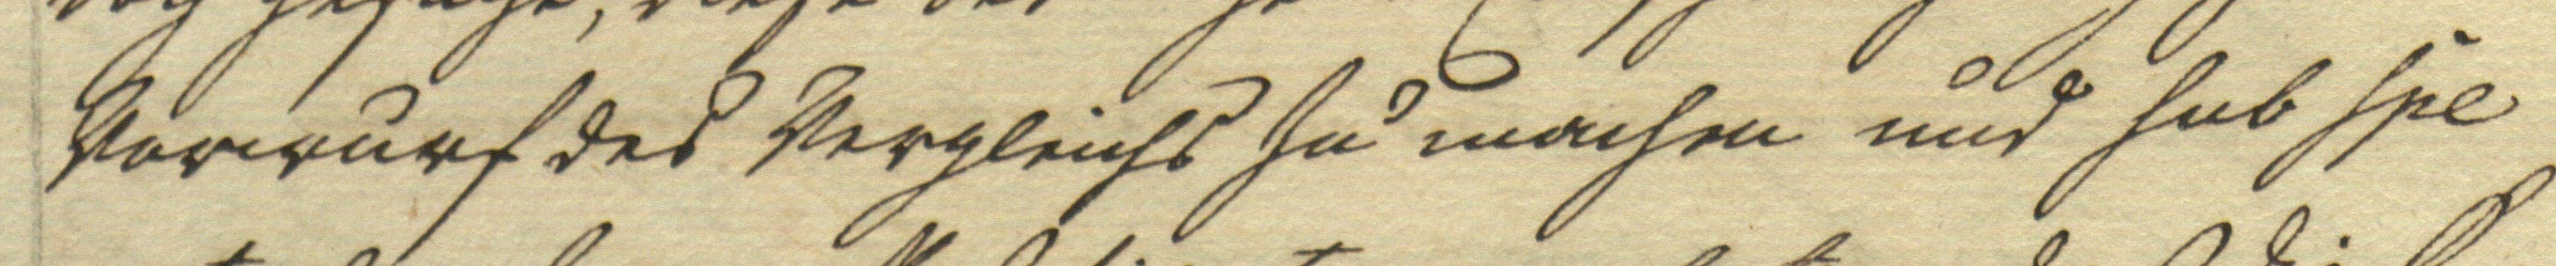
Vorwurf des Vergleichs zu machen und sub spe
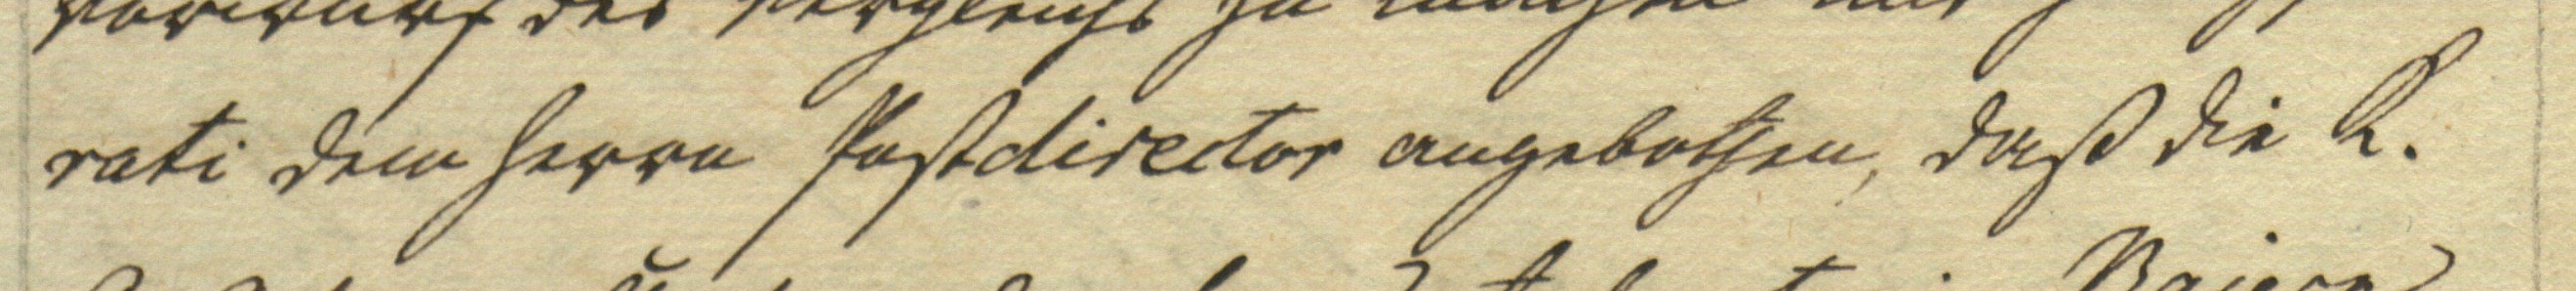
rati dem Herrn Postdirector angebothen, daß die K.
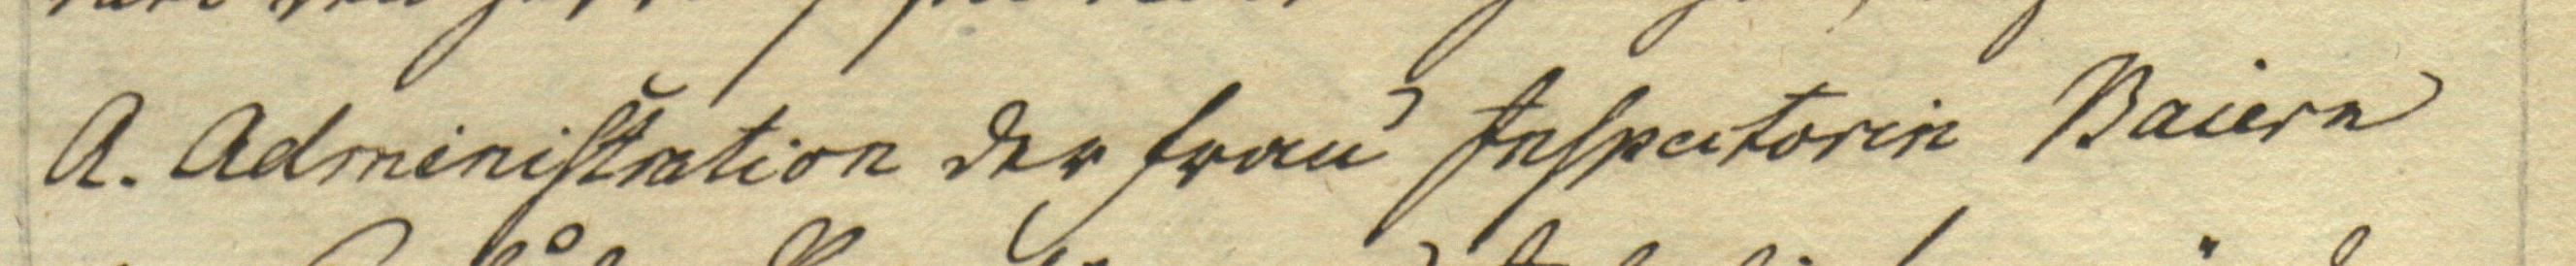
A. Administration der Frau Inspectorin Baiern
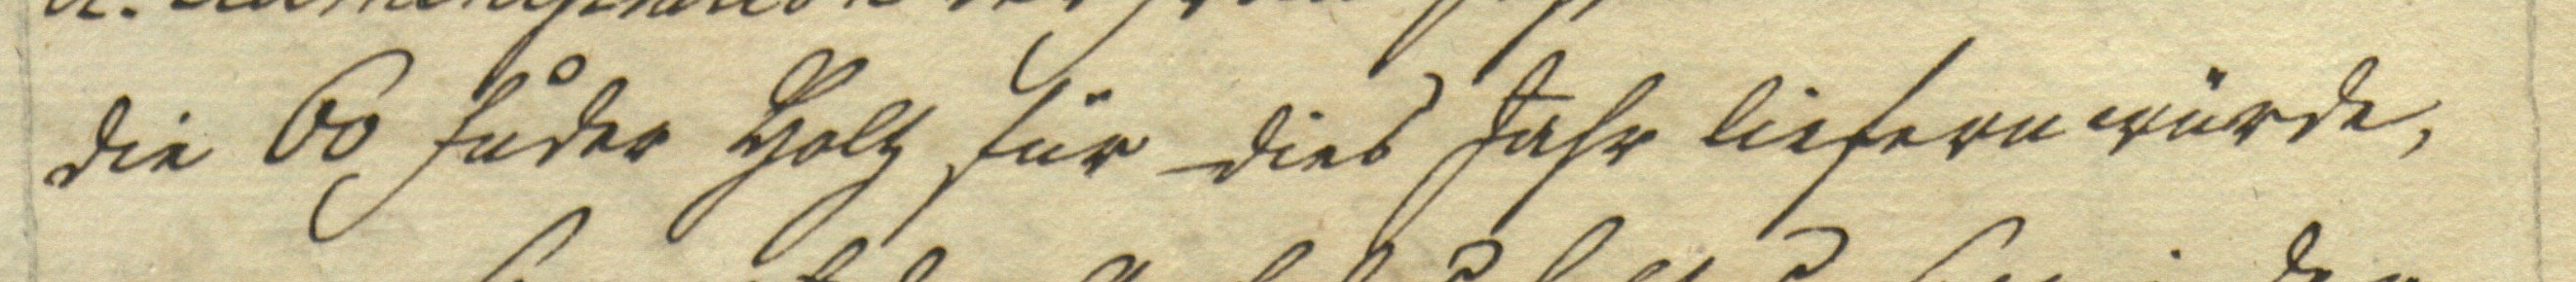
die 60 Fuder Holz für dies Jahr liefern würde,
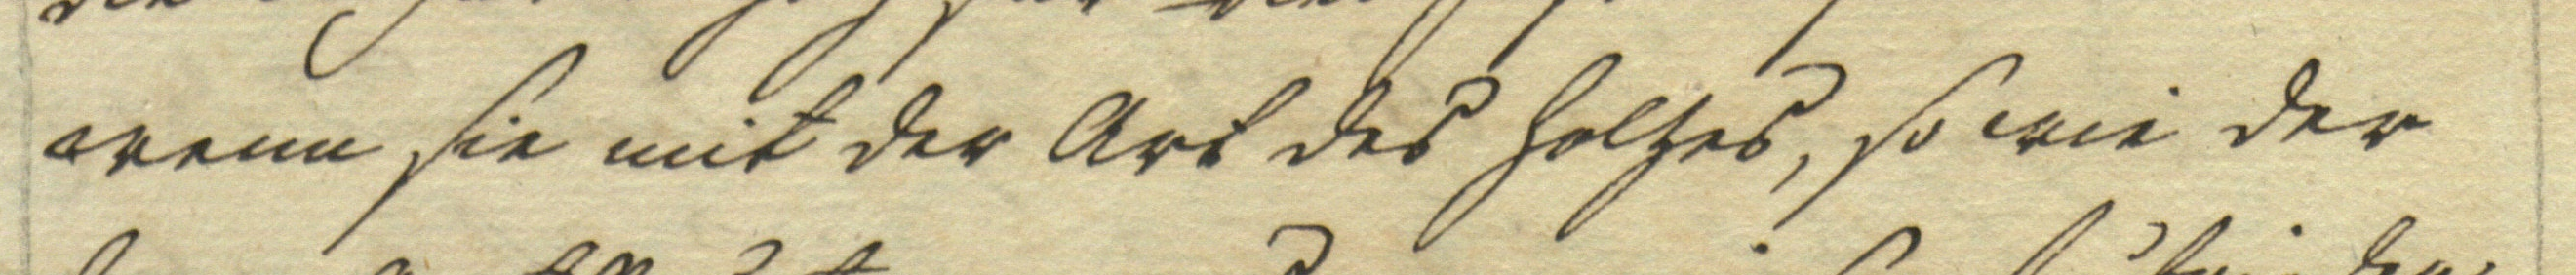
wenn sie mit der Art des Holzes, so wie der
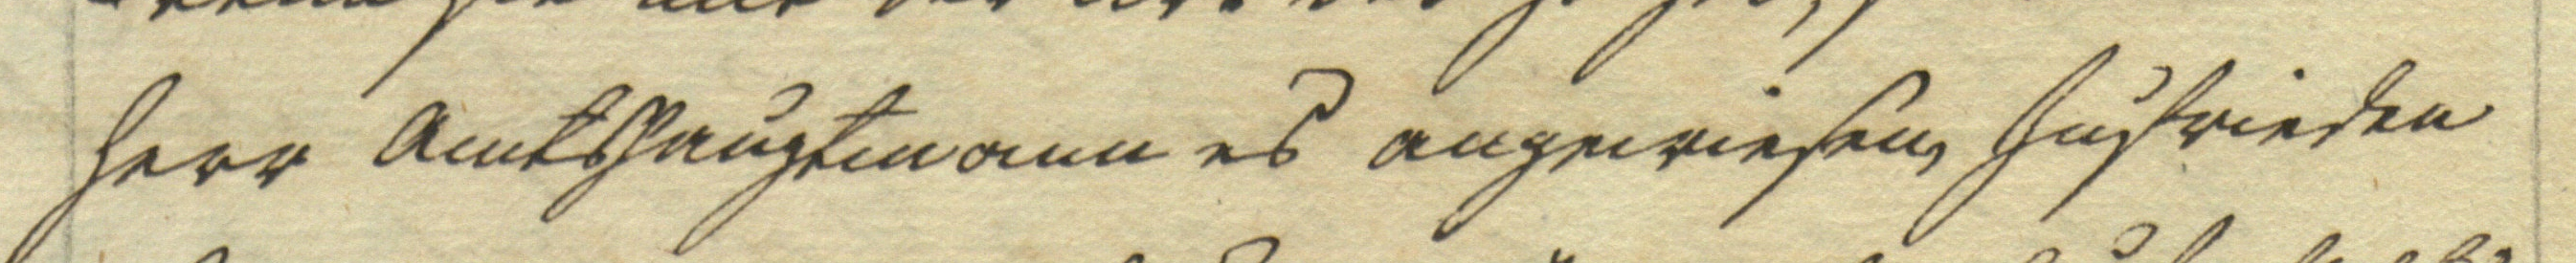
Herr Amtshauptmann es angewiesen, zufrieden
